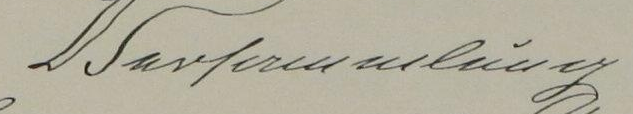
Versammlung
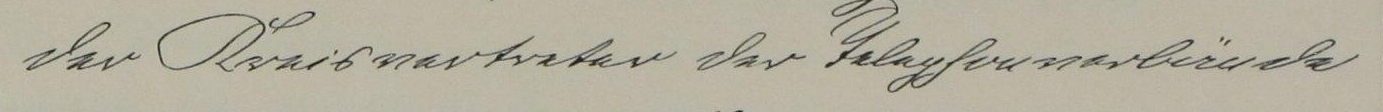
der Kreisvertreter der Telephonverbände
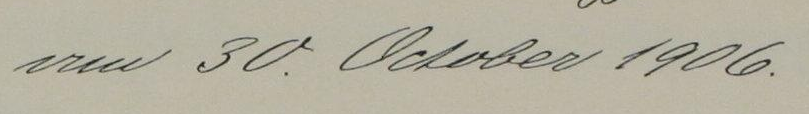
am 30. October 1906.
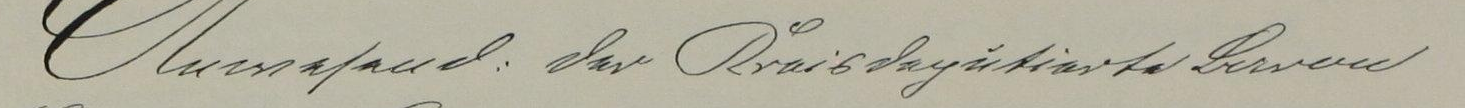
Anwesend: der Kreisdeputierte Baron
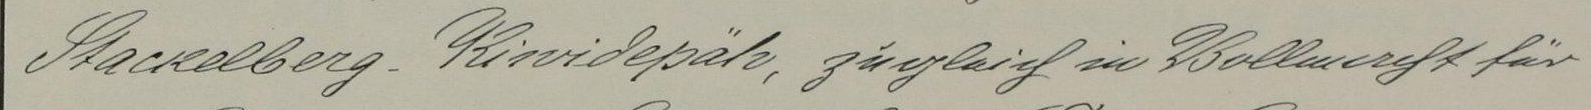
Stackelberg-Kiwidepäh, zugleich in Vollmacht für
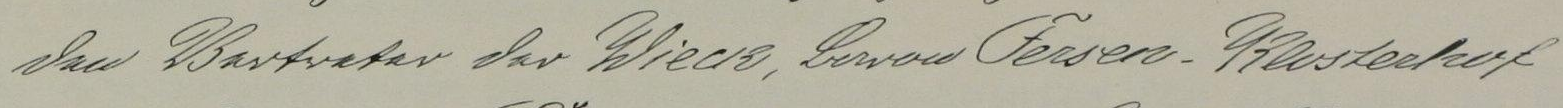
den Vertreter der Wieck, Baron Fersen-Klosterhof
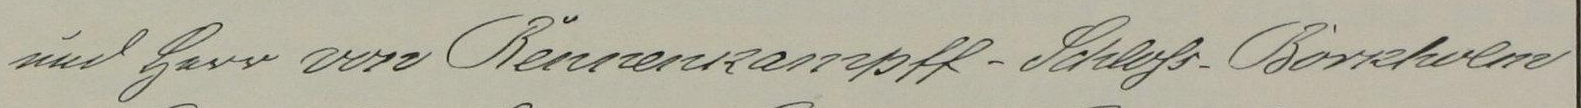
und Herr von Rennenkampff-Schloss-Borkholm
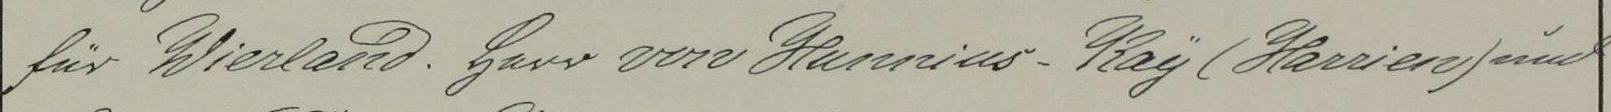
für Wierland. Herr von Hunnius-Kay (Harrien) und
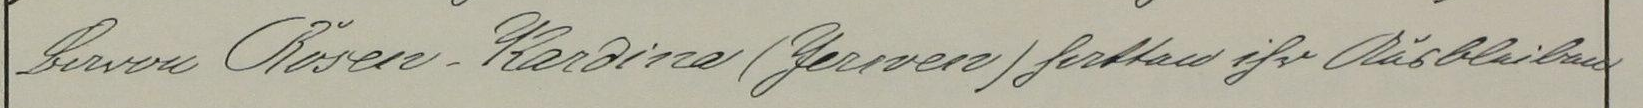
Baron Rosen-Kardina (Jerwen) hatten ihr Ausbleiben
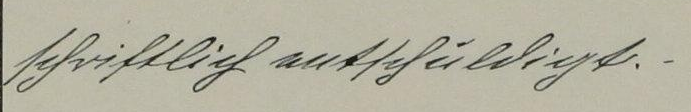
schriftlich entschuldigt.
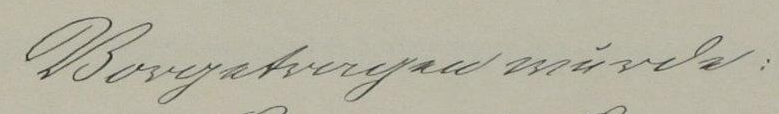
Vorgetragen wurde:
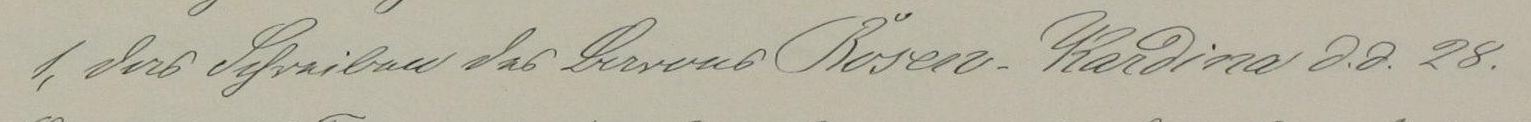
1. das Schreiben des Barons Rosen-Kardina d.d. 28.
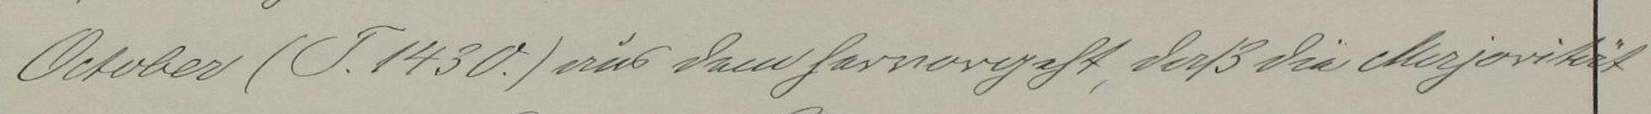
October (T.1430) aus dem hervorgeht, daß die Majorität
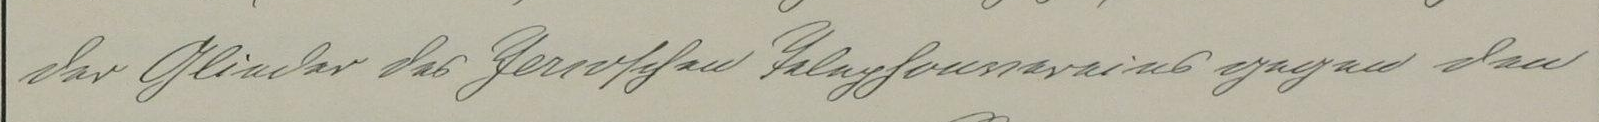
der Glieder des Jerwschen Telephonvereins gegen den
